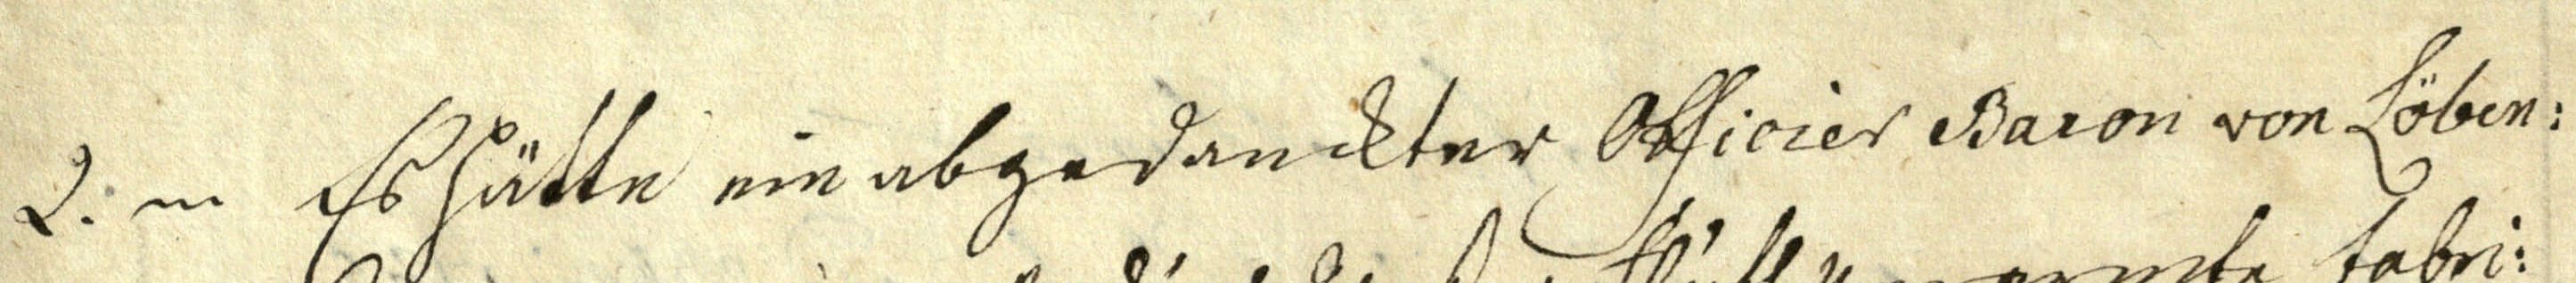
2. Es hätte ein abgedankter Officier Baron von Löben¬
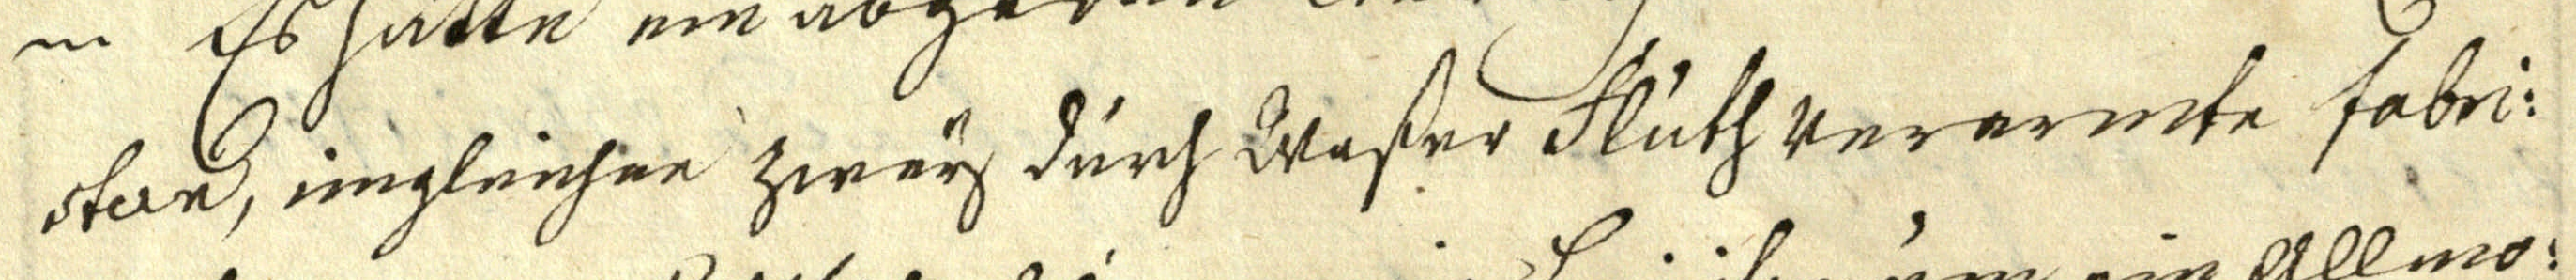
stern, imgleichen zweÿ durch Waßer Fluth verarmte Fabri¬
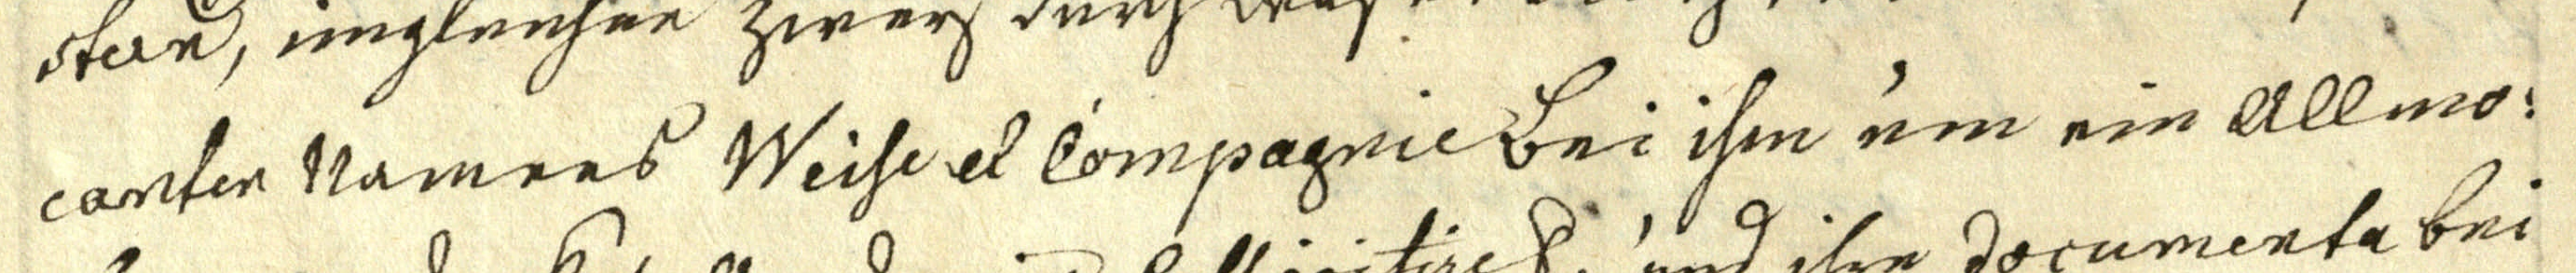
canten Namens Weihe et Compagnie bei ihm um ein Allmo¬
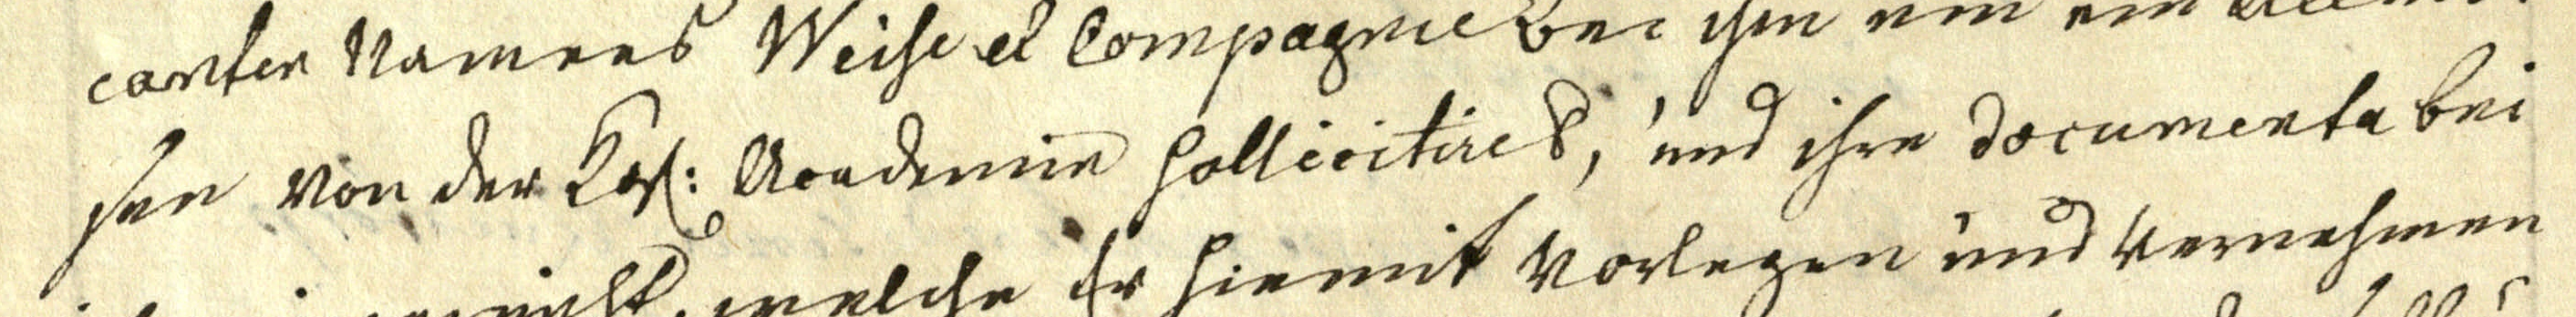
sen von der Kgl. Academie sollicitiret, und ihre documenta bei
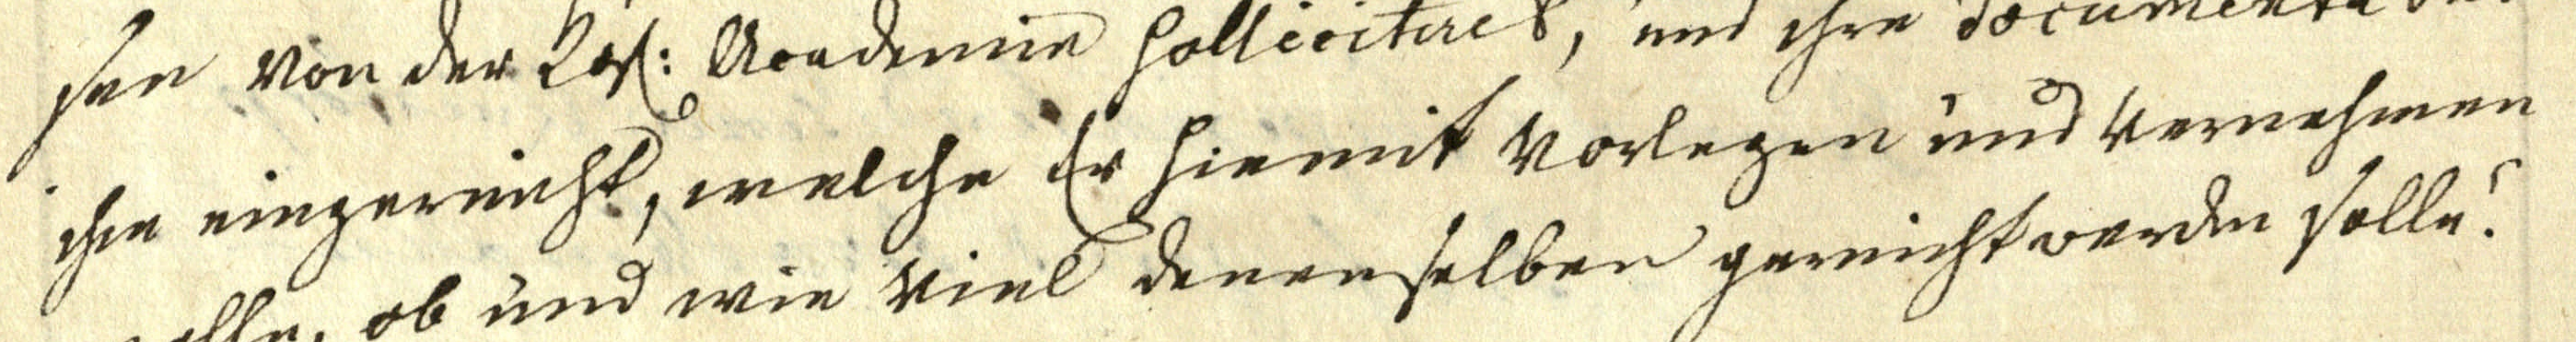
ihm eingereicht, welche Er hiemit vorlegen und vernehmen
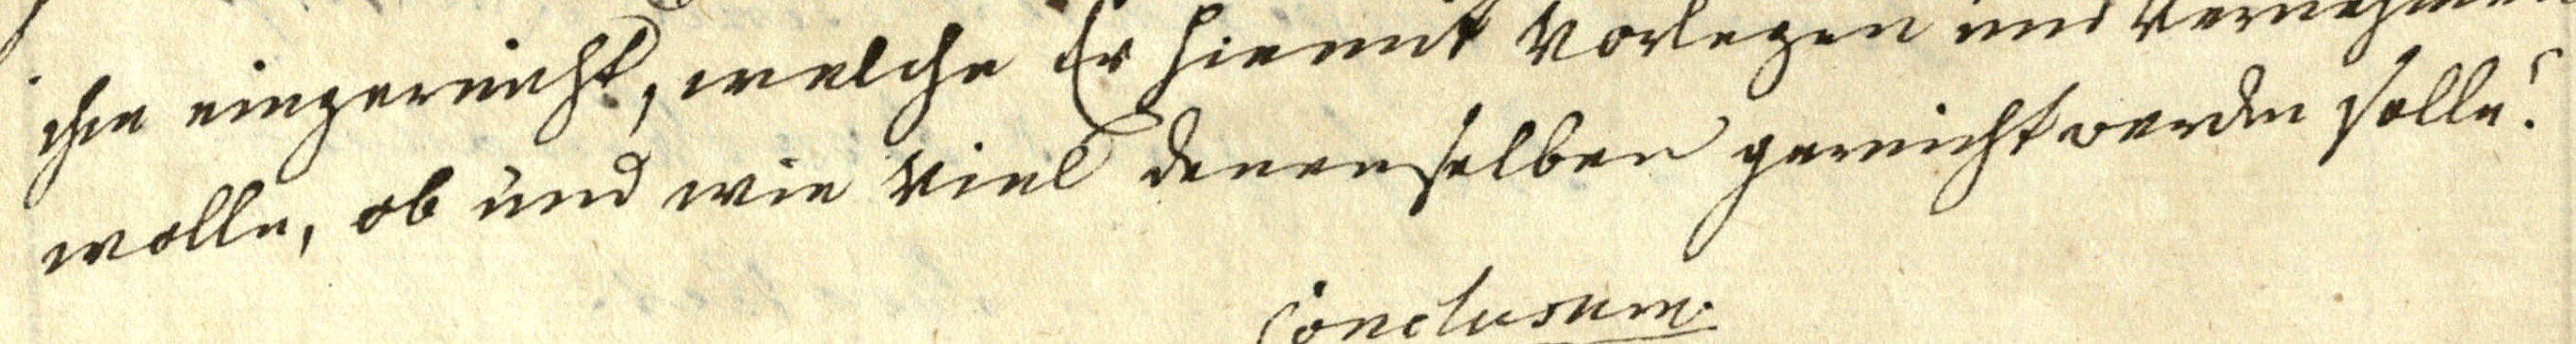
wolle, ob und wie viel denenselben gereicht werden solle?
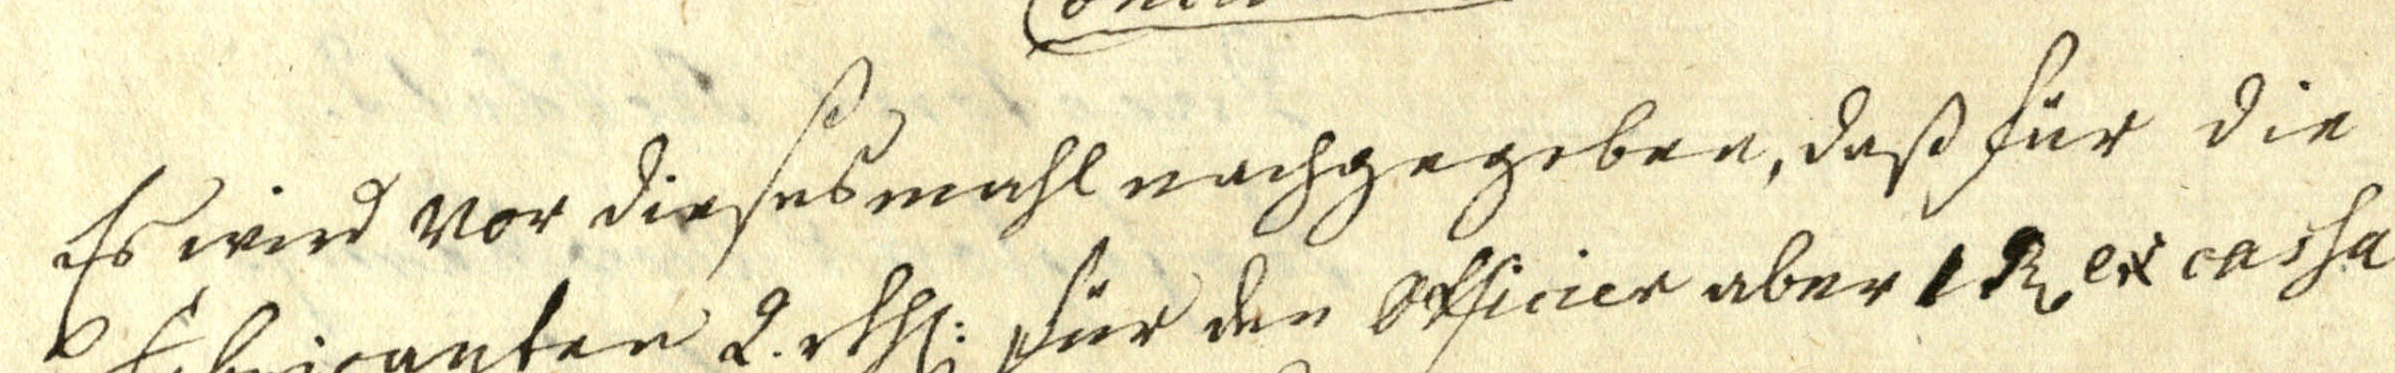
Es wird vor dieses mahl nachgegeben, daß für die
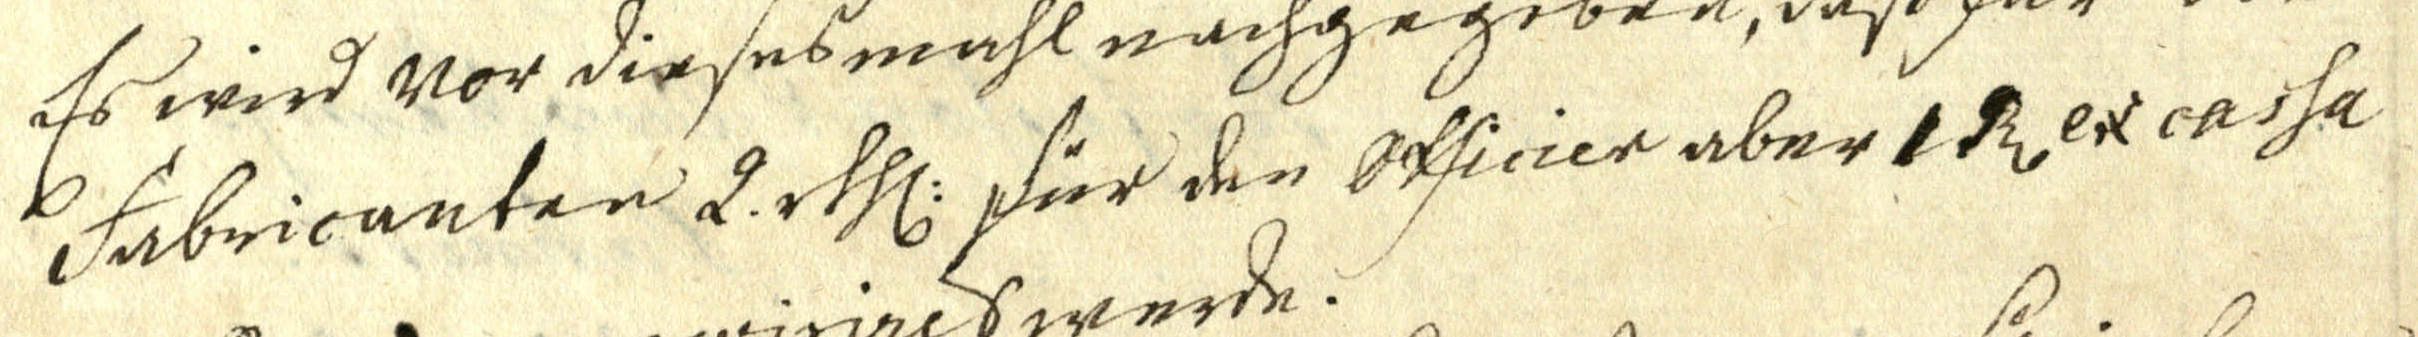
Fabricanten 2 rtl. für den Officier aber 1 R. ex cassa
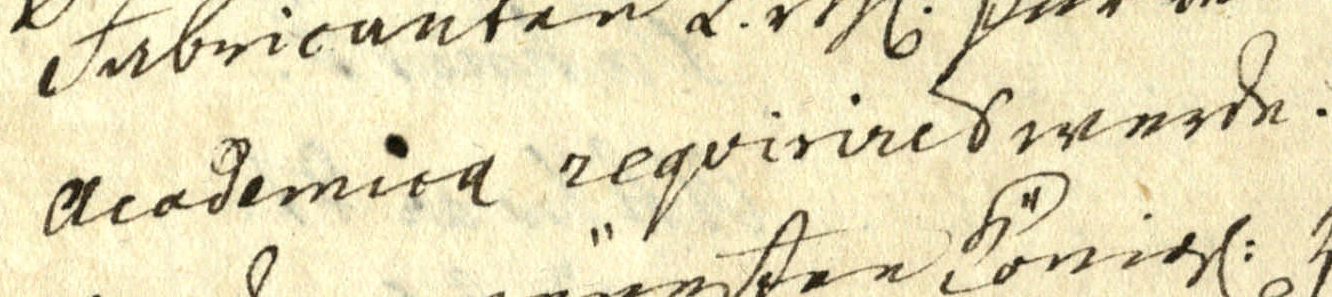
Academica requiriret werde.
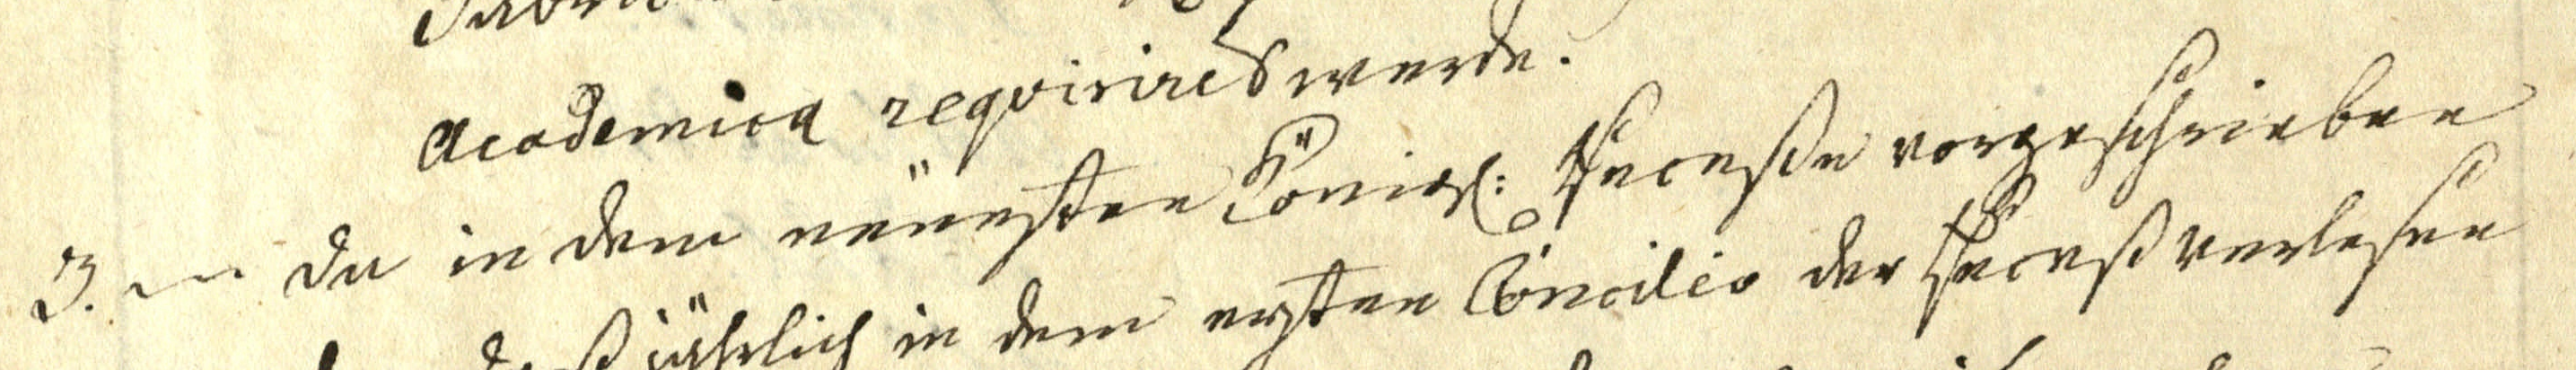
3. Da in dem neuesten Königl. Receße vorgeschrieben
